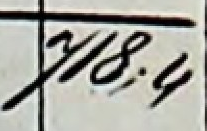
718,4
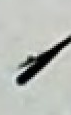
1
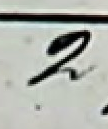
2
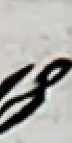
18
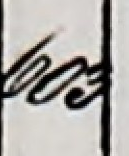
603
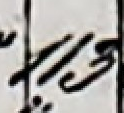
113
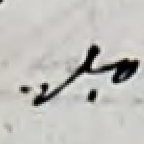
do
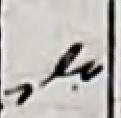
do
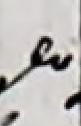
do
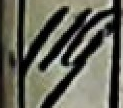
119
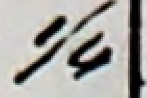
1/4
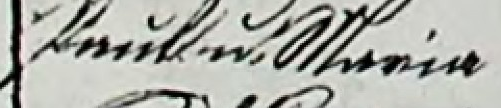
Paul u. Maria
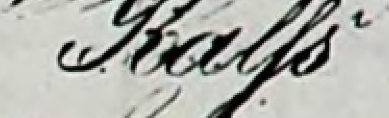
Kalss
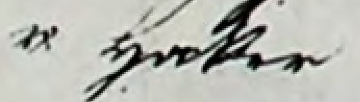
v. Hocker
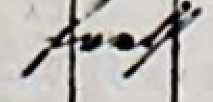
Forts.
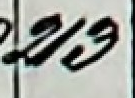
213
